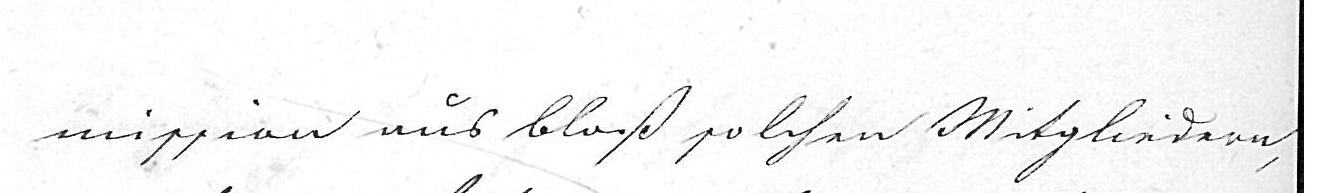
mission aus bloß solchen Mitgliedern,
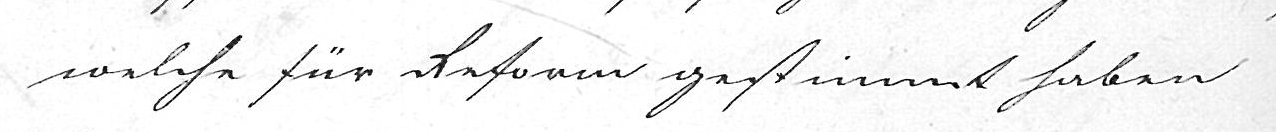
welche für Reform gestimmt haben
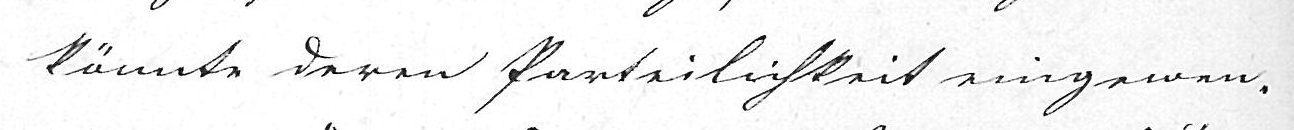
könnte deren Parteilichkeit eingewen-
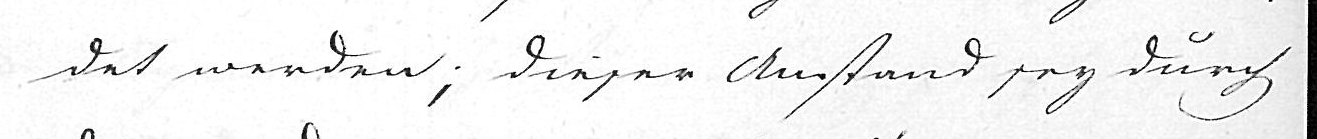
det werden; dieser Anstand sey durch
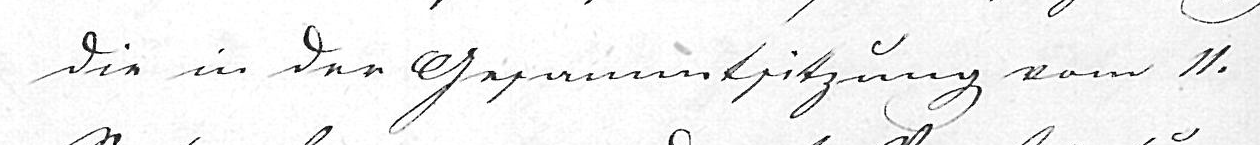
die in der Gesammtsitzung vom 11.
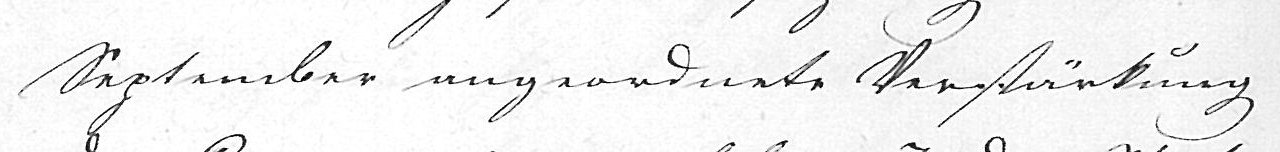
September angeordnete Verstärkung
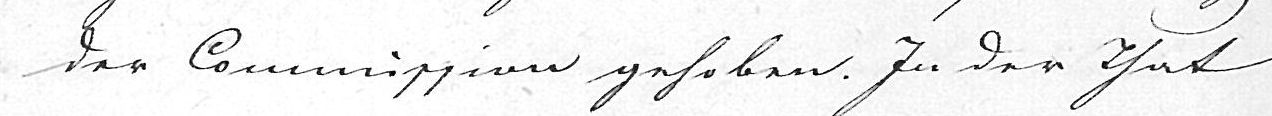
der Commission gehoben. In der That
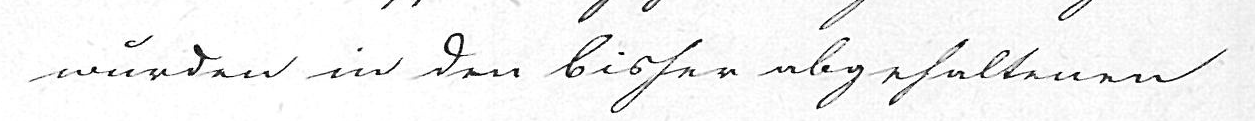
wurden in den bisher abgehaltenen
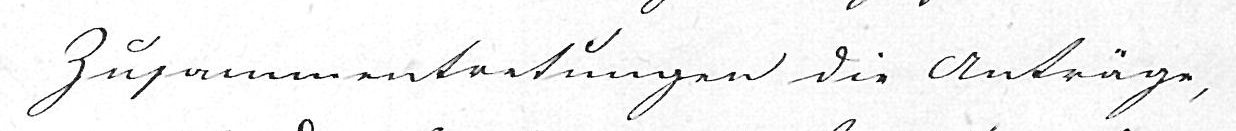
Zusammentretungen die Anträge,
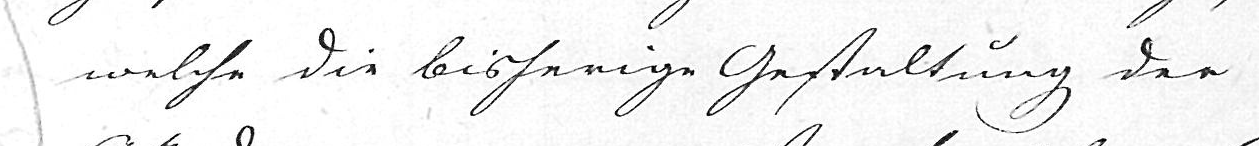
welche die bisherige Gestaltung der
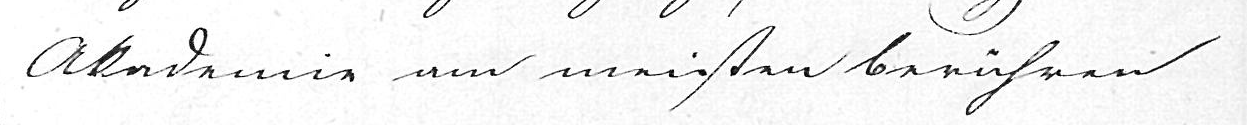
Akademie am meisten berühren
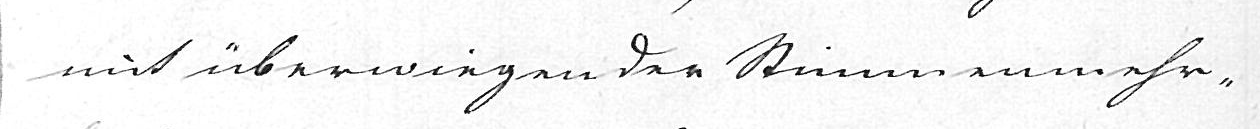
mit überwiegender Stimmenmehr-
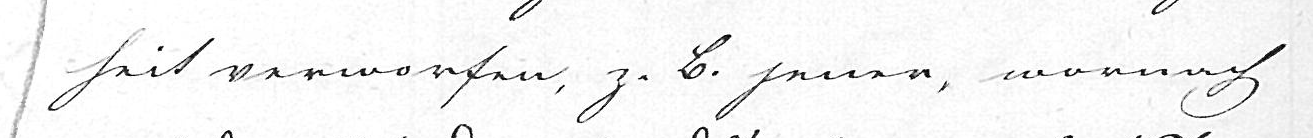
heit verworfen, z.B. jener, wornach
